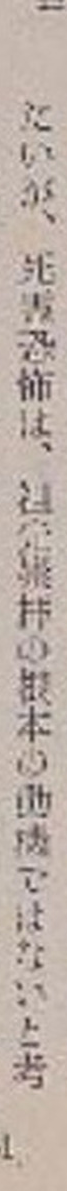たいが、死霊恐怖は、祖先崇拝の根本の動機ではないと考

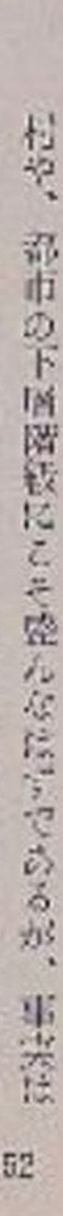村や、都市の下層階級にこそ盛んなはずであるが、事実は
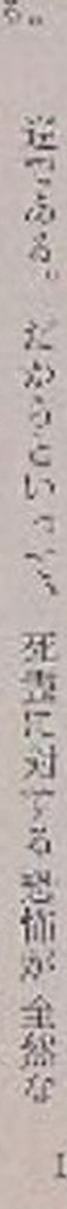逆である。だからといって、死霊に対する恐怖が全然な
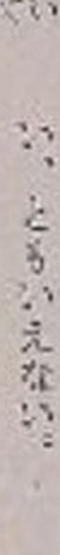い、ともいえない。
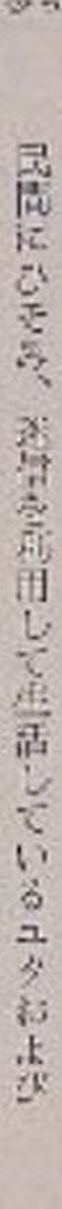民間にひそみ、死霊を利用して生活しているユタおよび
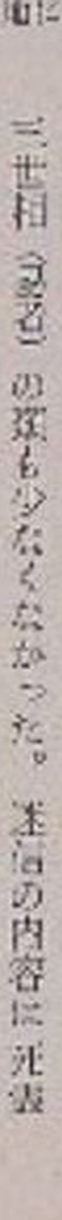三世相(易者)の類も少なくなかった。迷信の内容は死霊
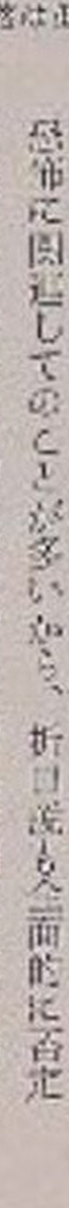恐怖に関連してのことが多いから、折口説も全面的に否定
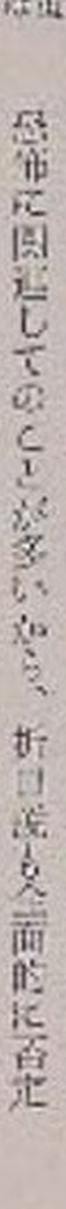恐怖に関連してのことが多いから、折口説も全面的に否定
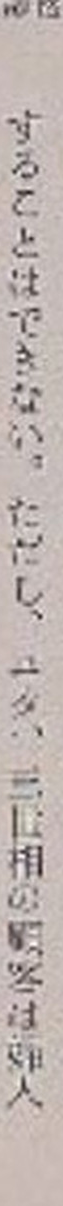することはできない。ただし、ユタや三世相の顧客は婦人
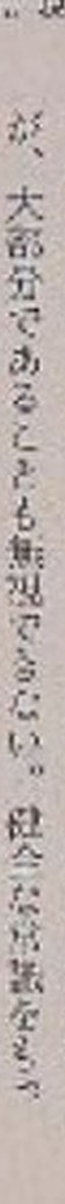が、大部分であることも無視できない。健全な常識をもっ
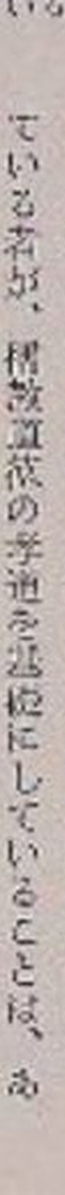ている者が、儒教道徳の孝道を基礎にしていることは、あ
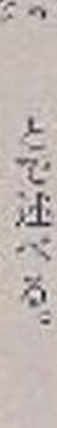とで述べる。
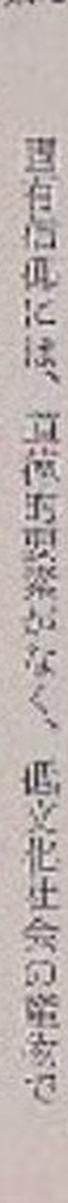固有信仰には、道徳的要素がなく、低文化社会ので
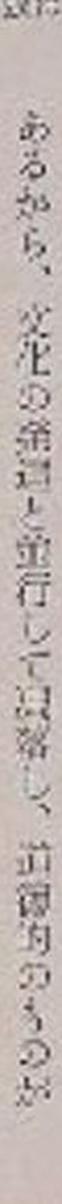あるから、文化の発達と並行して凋落し、道徳的のものが
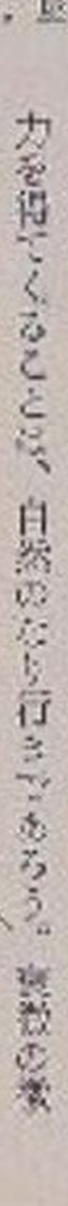力を得てくることは、自然のなり行きであろう。衰微の徴
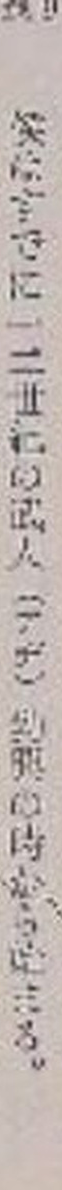候はすでに一二世紀の武人(アヂ)勃興の時から始まる。
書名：沖縄固有信仰のおとろえ
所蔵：University of the Ryukyus Library
